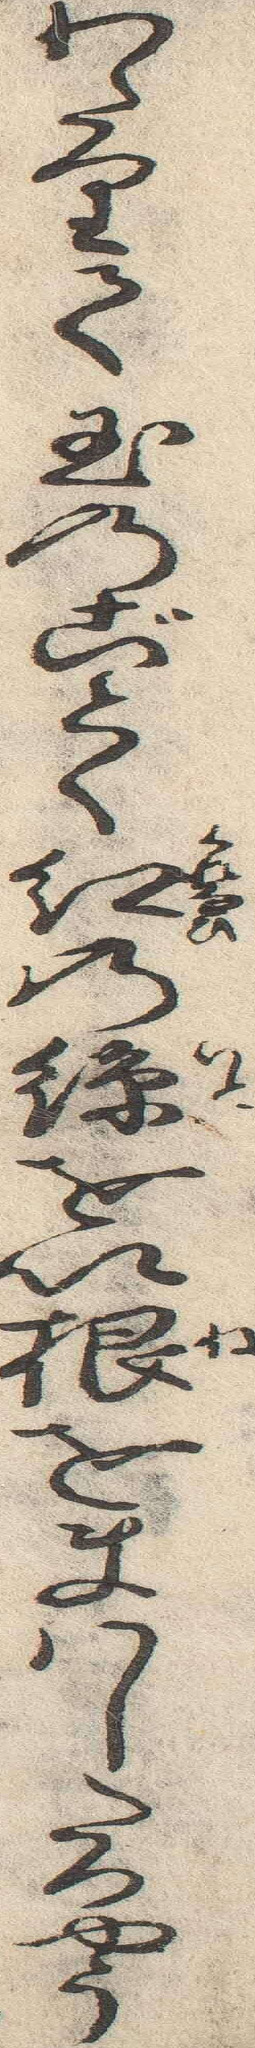わたりて玉のごとく紅の糸を以根をまはしたるやう
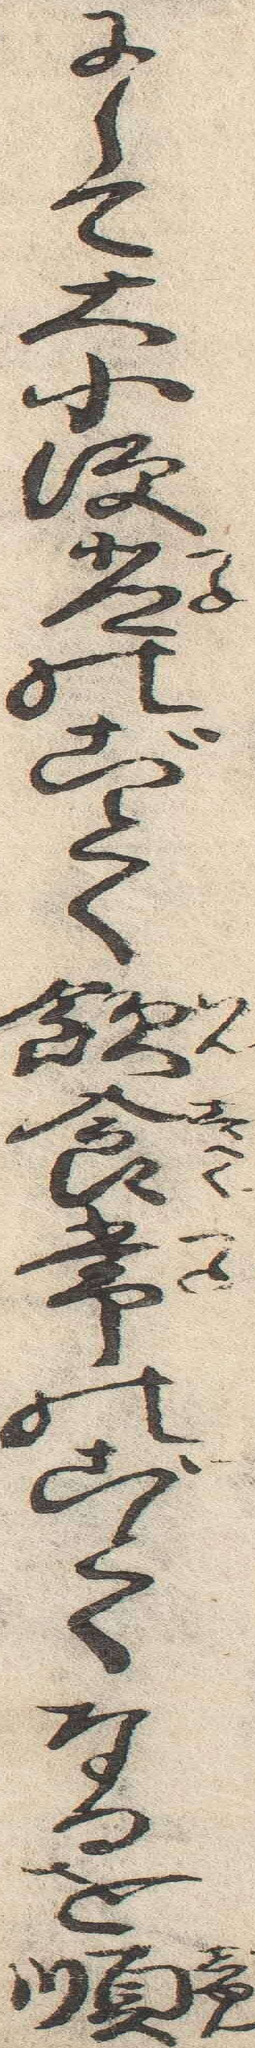にして大小便常のごとく飲食常のごとくなるを順
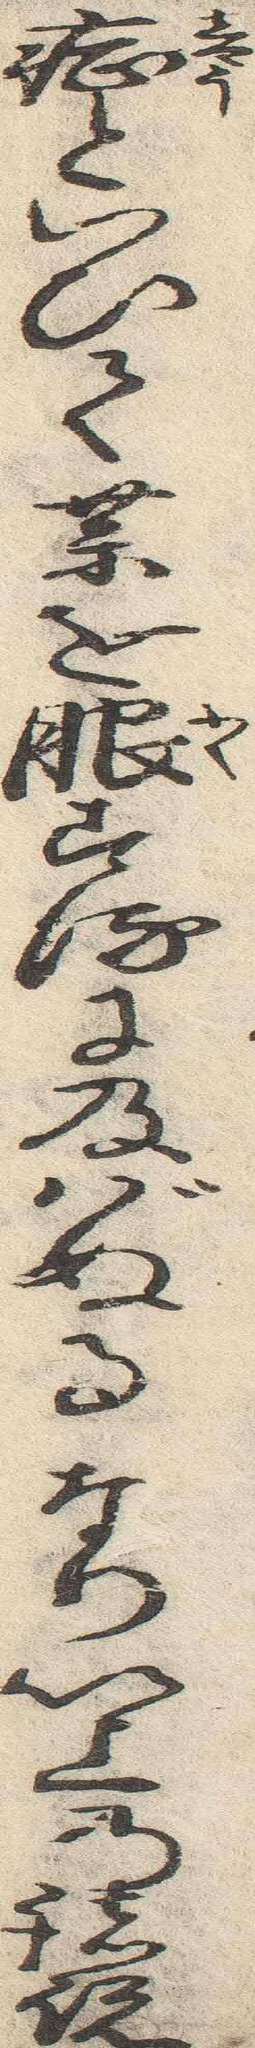症といひて薬を服するに及ばぬるなり以上の諸説
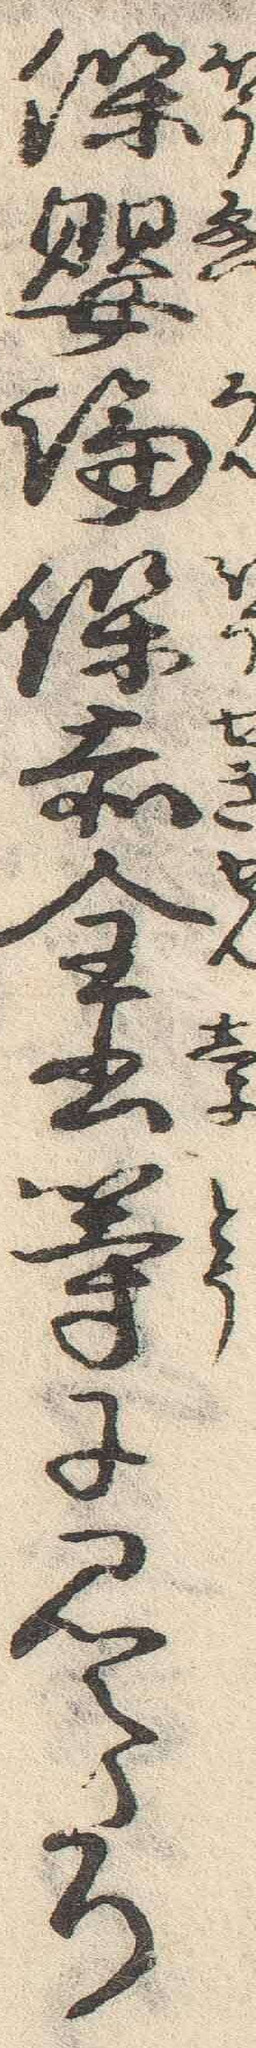保嬰論保赤全書等に見えたり
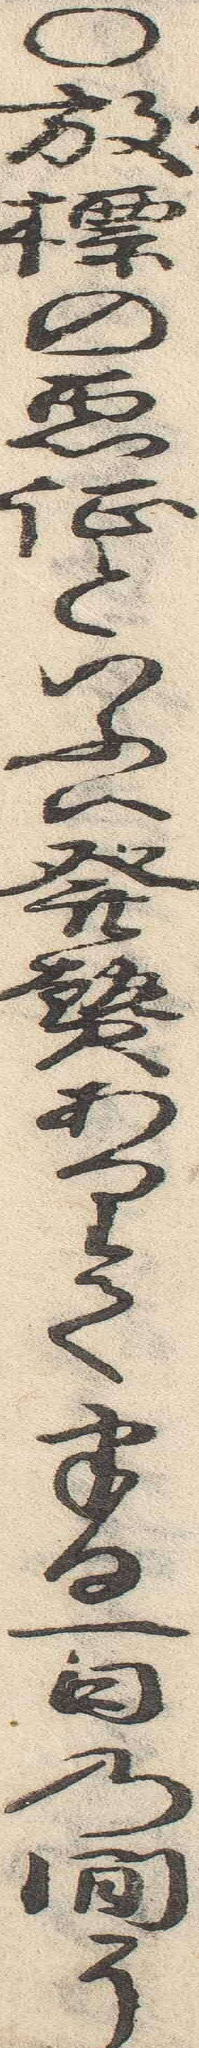○放標の悪証といふは発熱ありて半日一日の間に
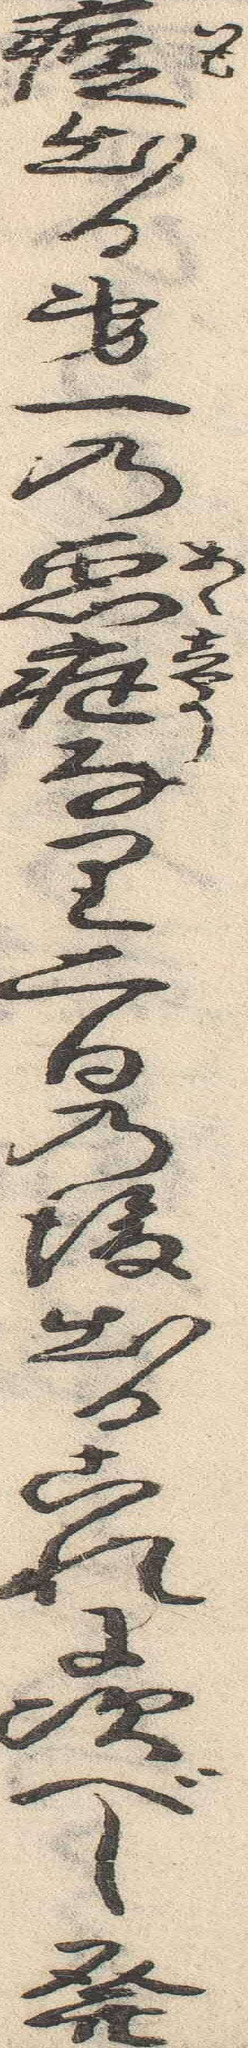痘出る第一の悪症なり二日の後出るこれに次べし発
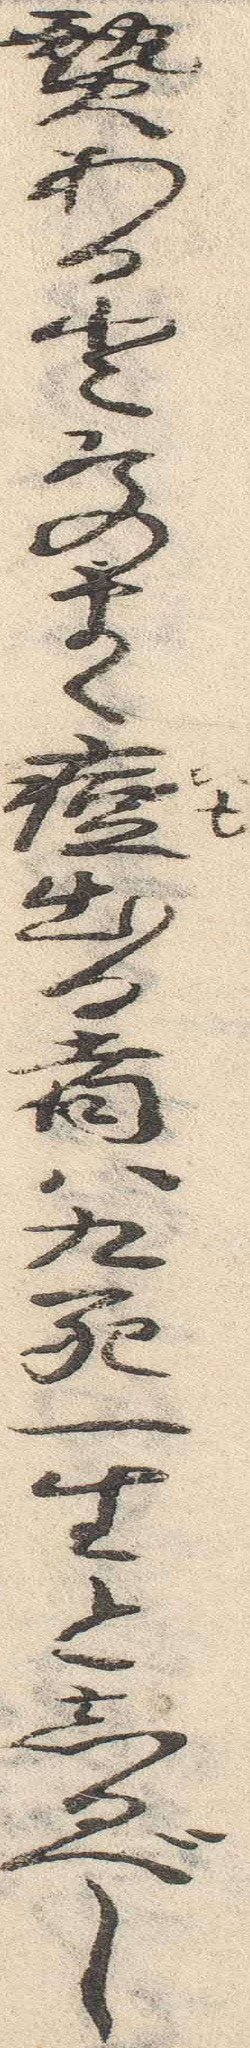熱あるとそのまゝ痘出る者は九死一生としるべし
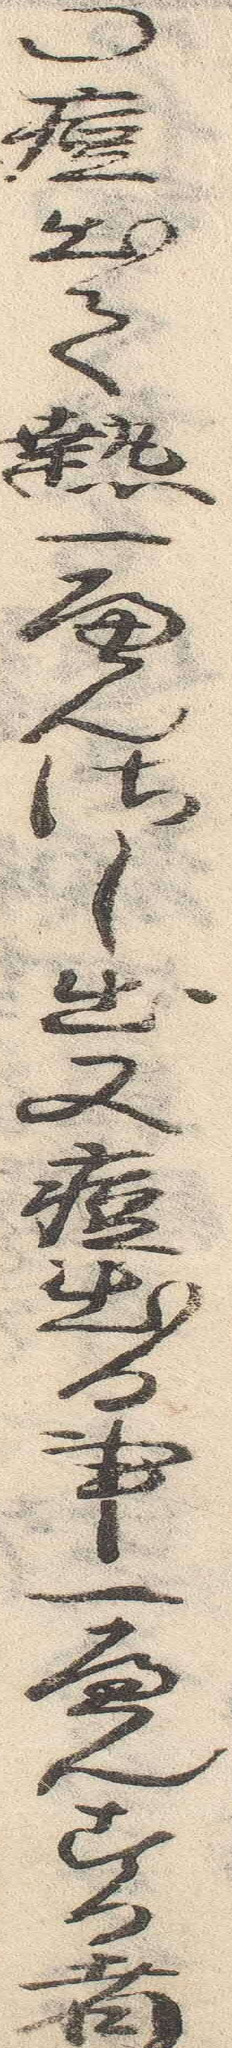○痘出て熱一へんさし出又痘出る事一へんする者
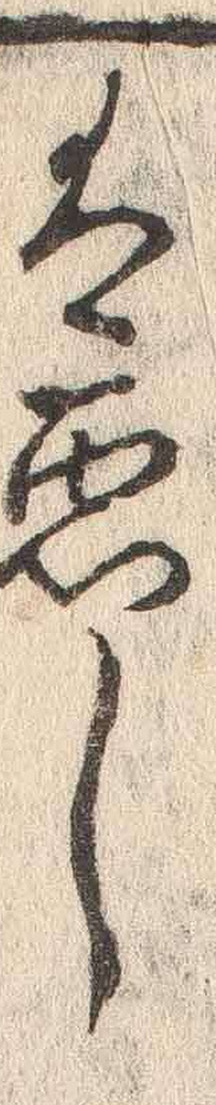は悪し
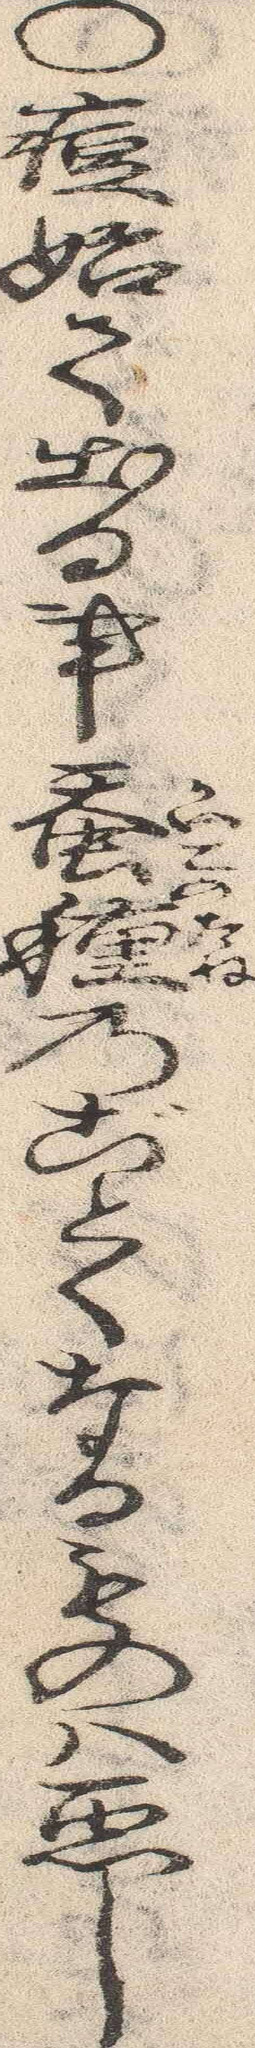○痘始て出る事蚕種のごとくなるものは悪し
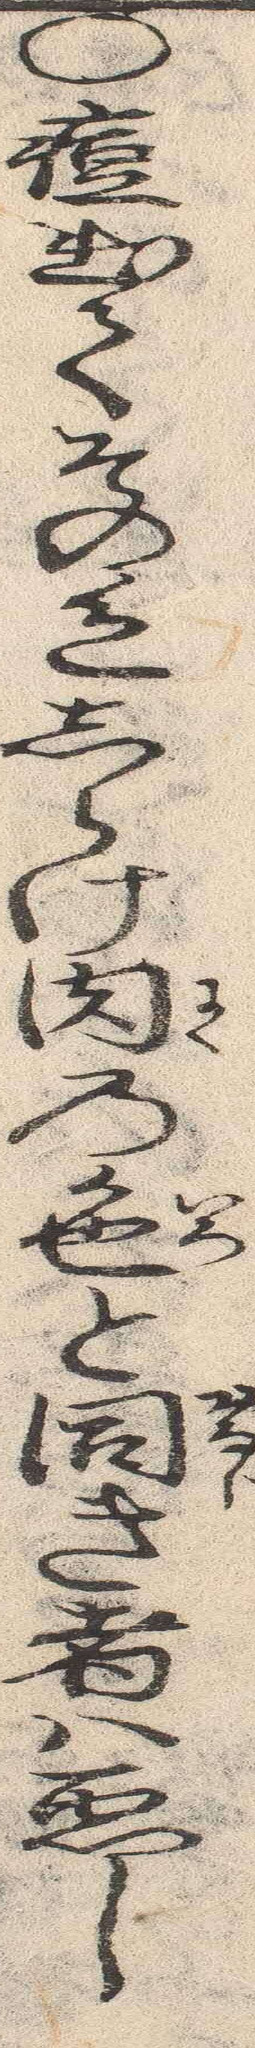○痘出てその色しらけ肉の色と同き者は悪し
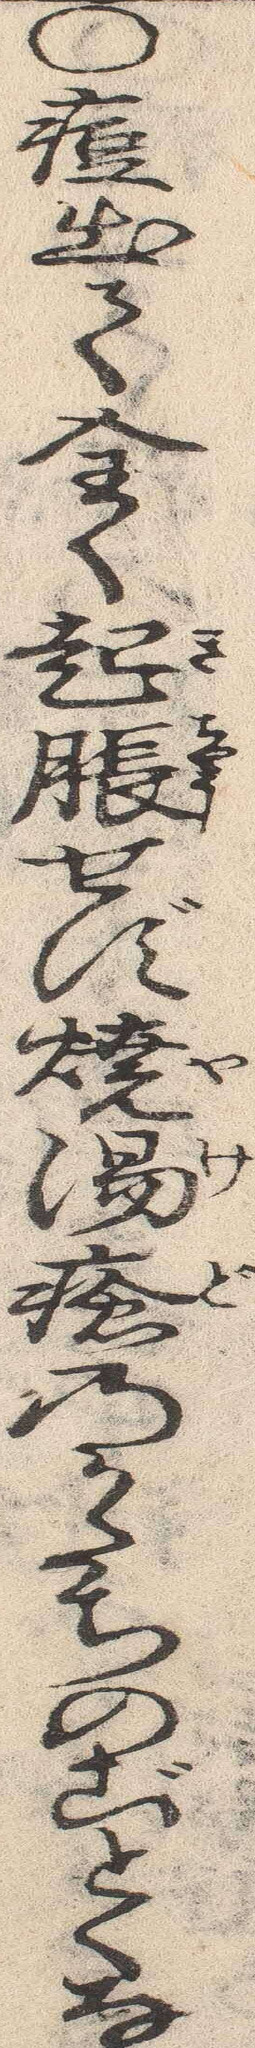○痘出て全く起脹せず焼湯瘡のかたちのごとくな
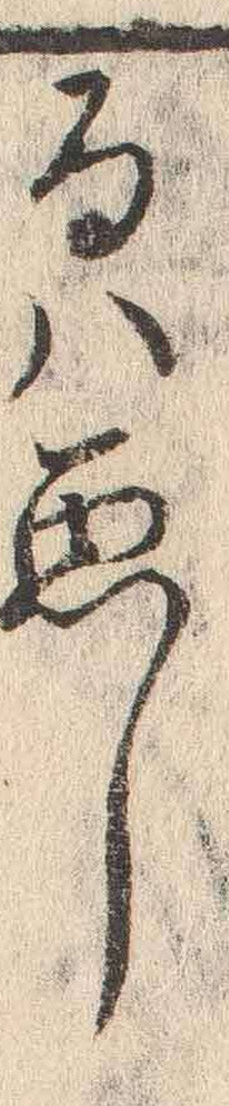るは悪し
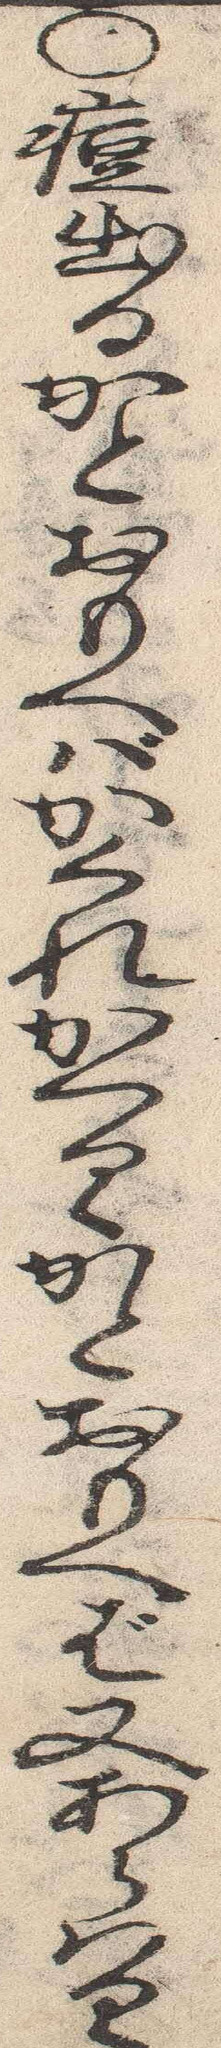○痘出るかとおもへばかくれかくるゝかとおもへば又あらはるゝ
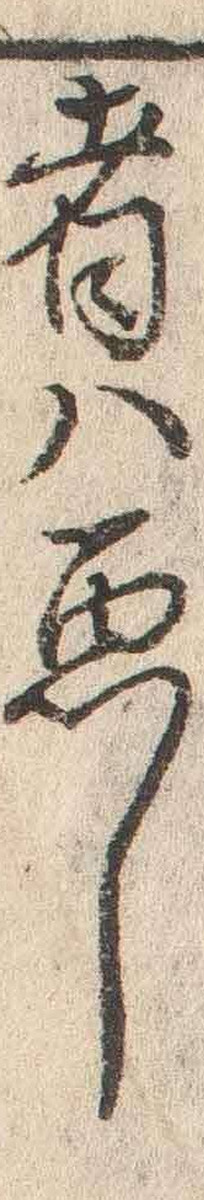者は悪し
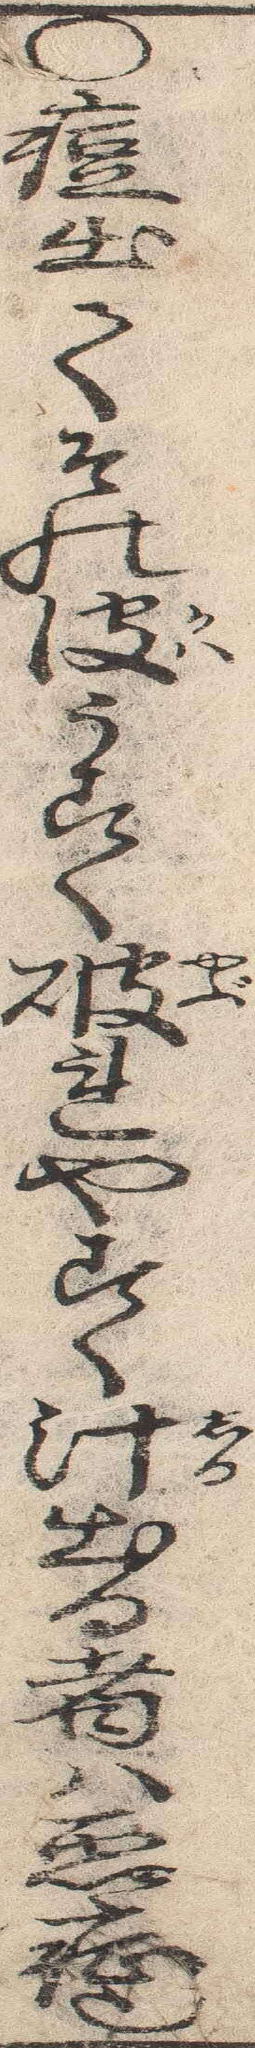○痘出てその皮うすく破れやすく汁出る者は悪症也
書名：小児必用養育草
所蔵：東京学芸大学附属図書館 国文学研究資料館
